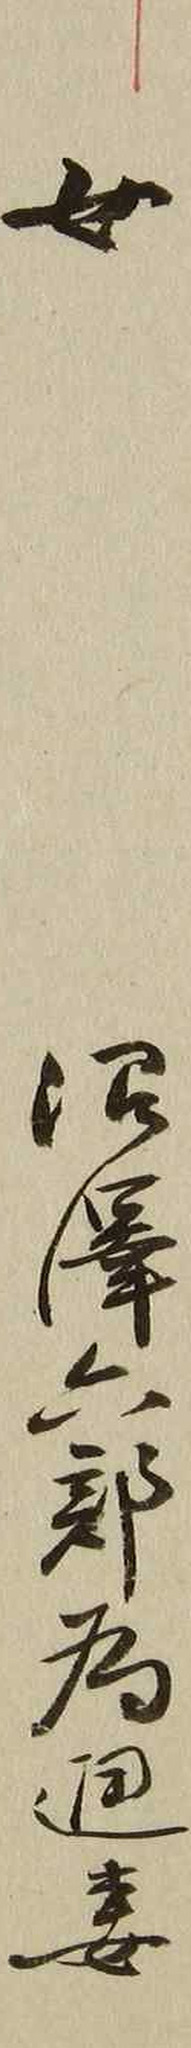女沼沢六郎為通妻
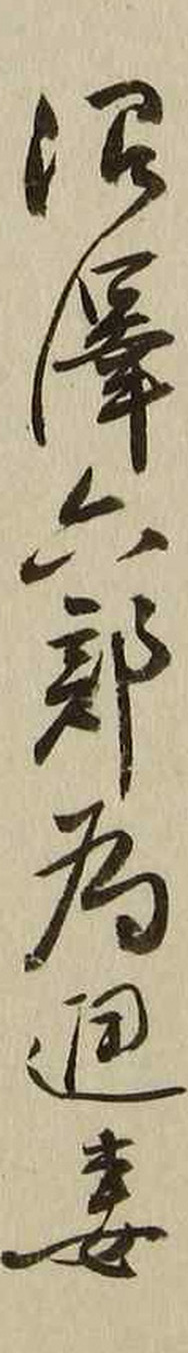女沼沢六郎為通妻
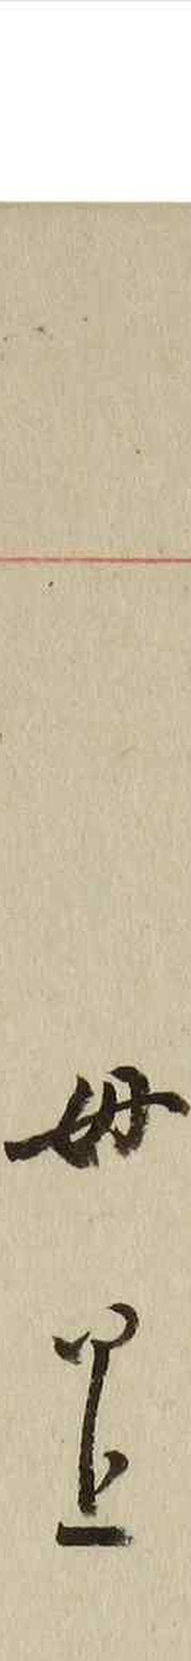母同上
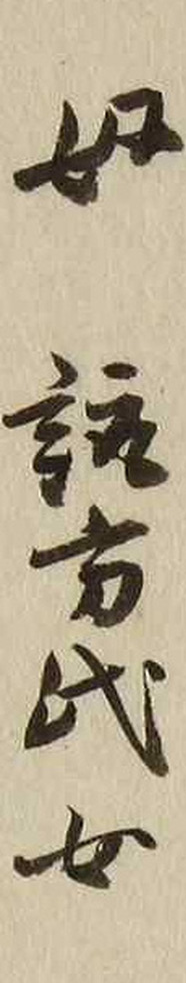母諏方氏女
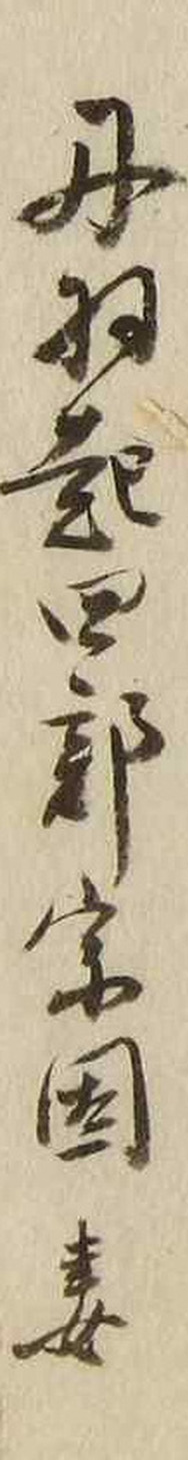丹羽起四郎宗因妻

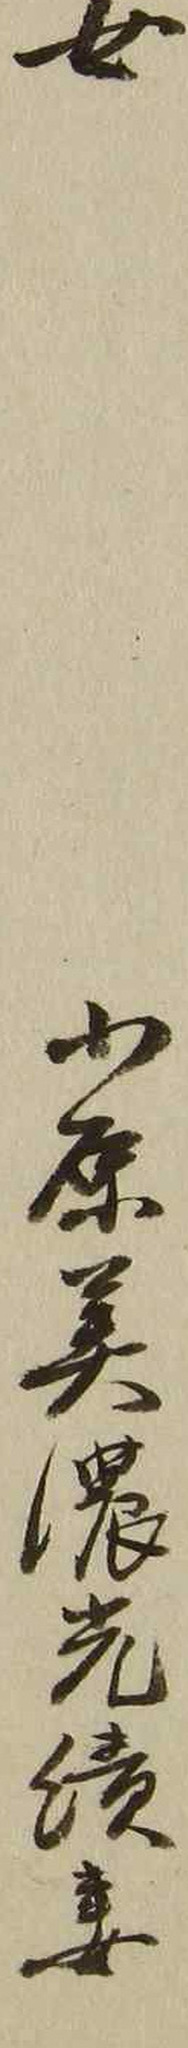女小原美濃光績妻
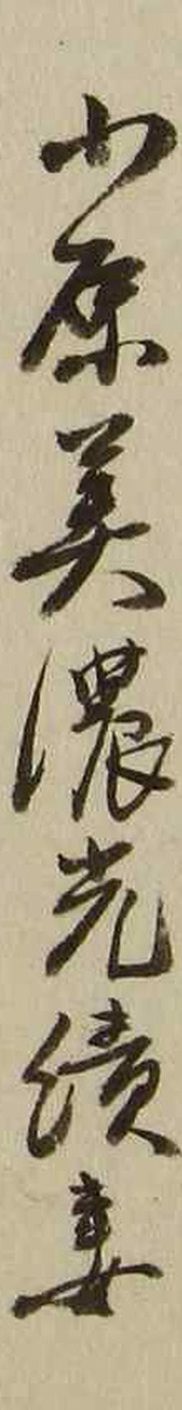女小原美濃光績妻
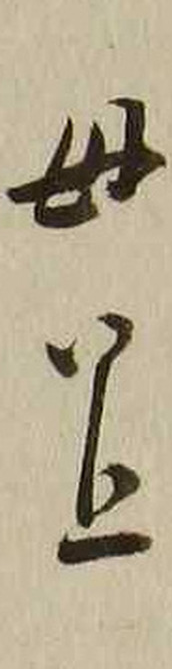母同上
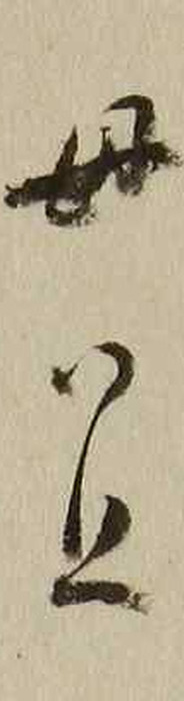母同上
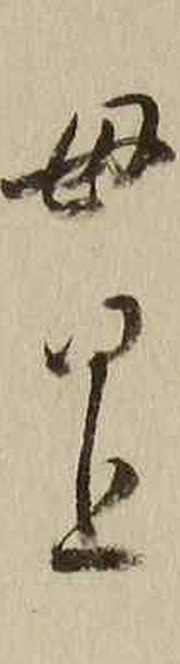母同上
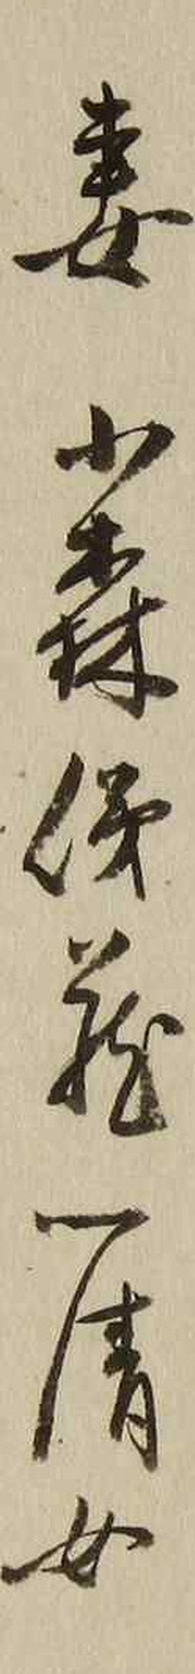妻小森俤蔵一清
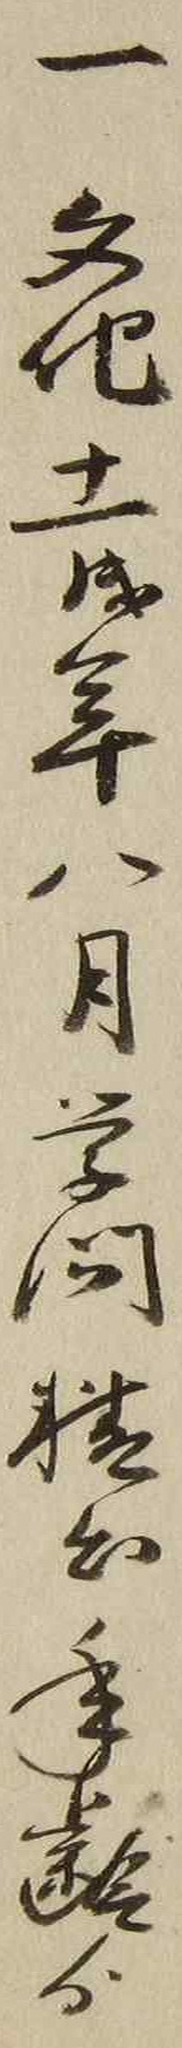一文化十一戌年八月学問精出年齢ゟ
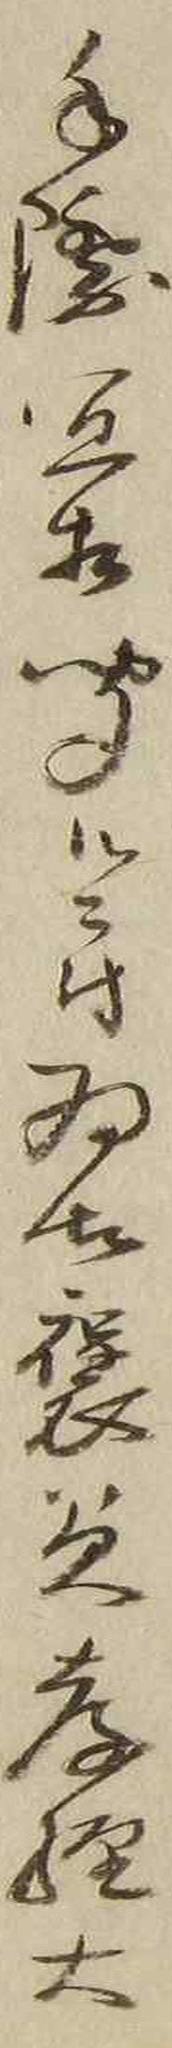手際宜相聞候に付為御褒美孝経大
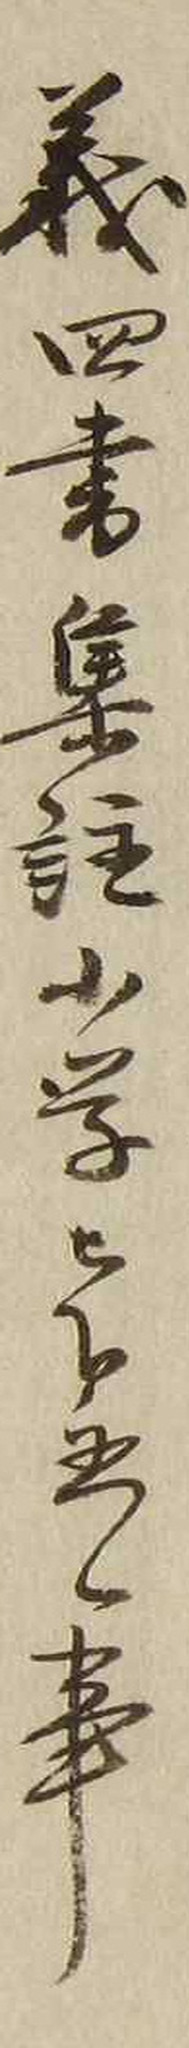義四書集註小学被下置候事
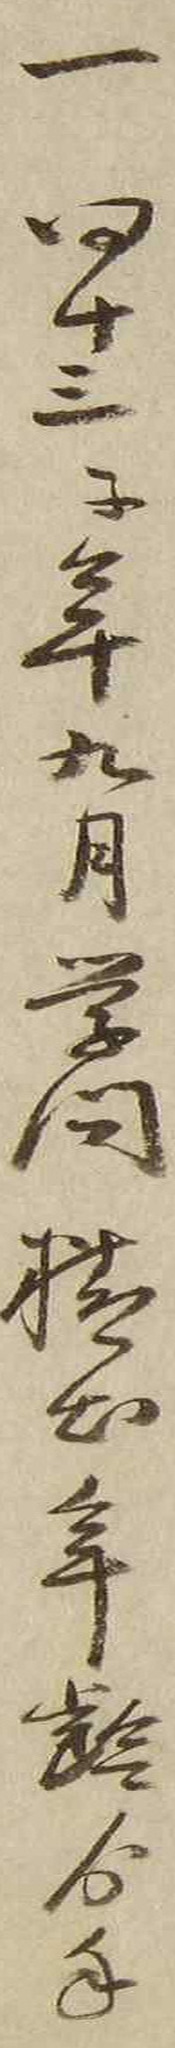一同十三子年九月学問精出年齢ゟ手

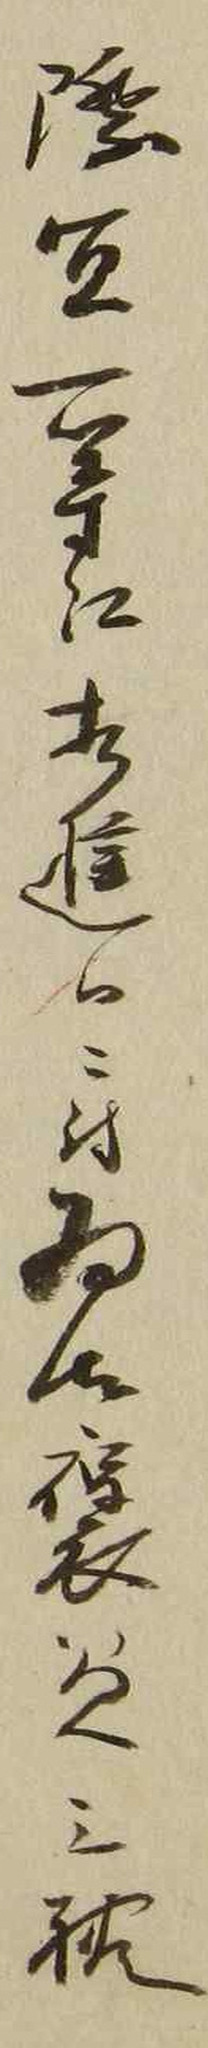際宜一等江相進候に付為御褒美三祝
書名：諸士系譜　巻之269　さ之部1
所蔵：会津若松市立会津図書館
